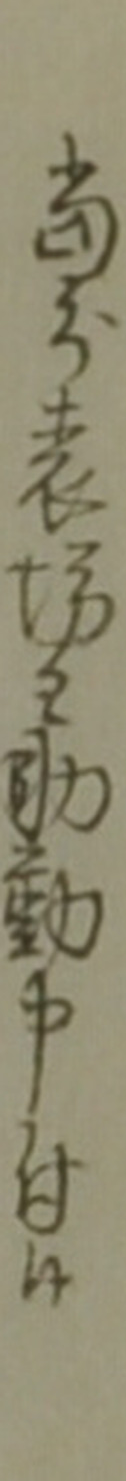当分表坊主助勤申付候
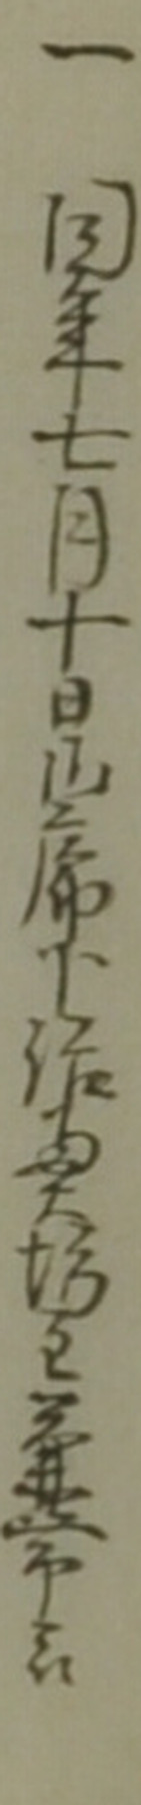一同年七月十日御廊下詰奥坊主兼帯被
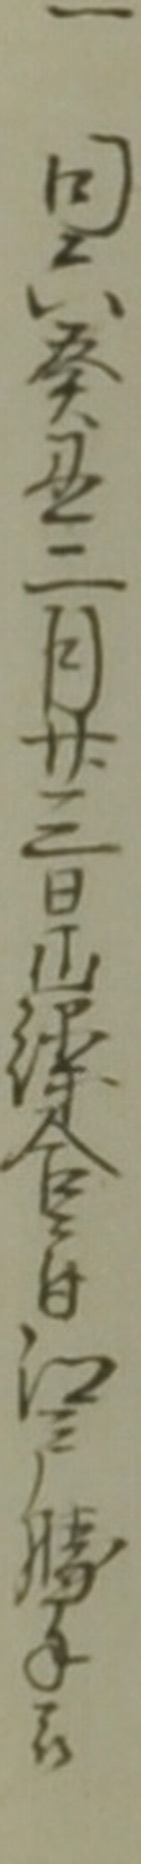一同六癸丑二月廿三日御繰合ニ付江戸勝手被
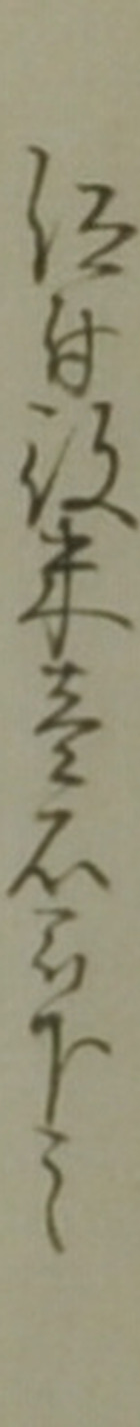仰付役米壱石被下之
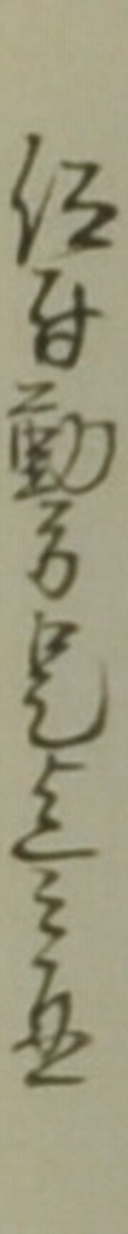仰付勤方是迄之通
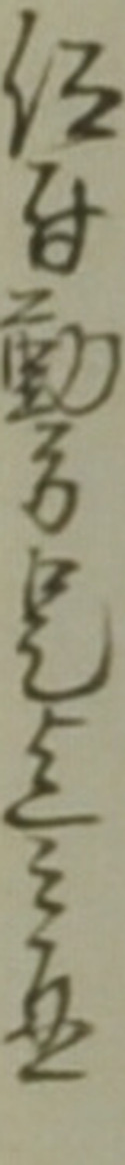仰付勤方是迄之通

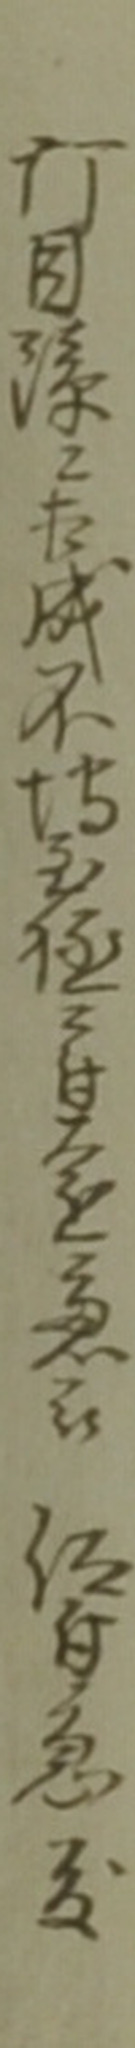御目障ニ相成不埒至極ニ付遠慮被仰付急度
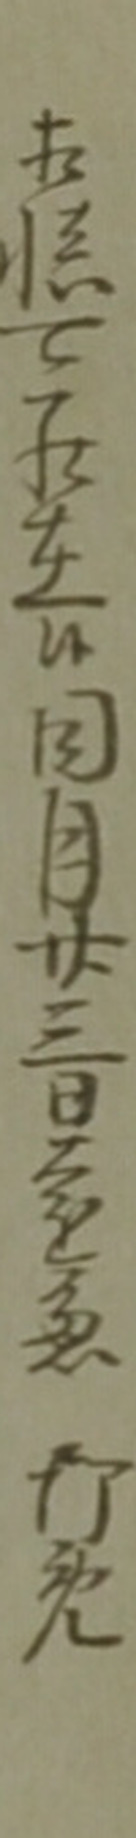相慎可罷在候同月廿三日遠慮御免

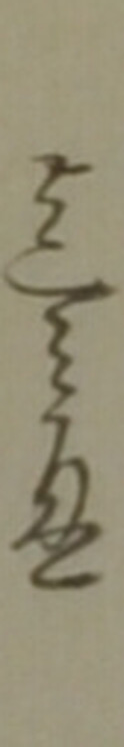迄之通
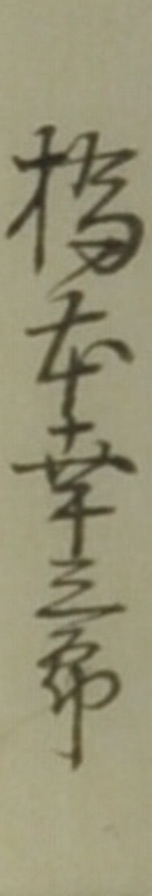橋本幸三郎

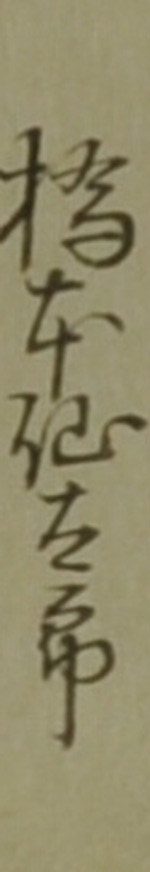橋本仙太郎
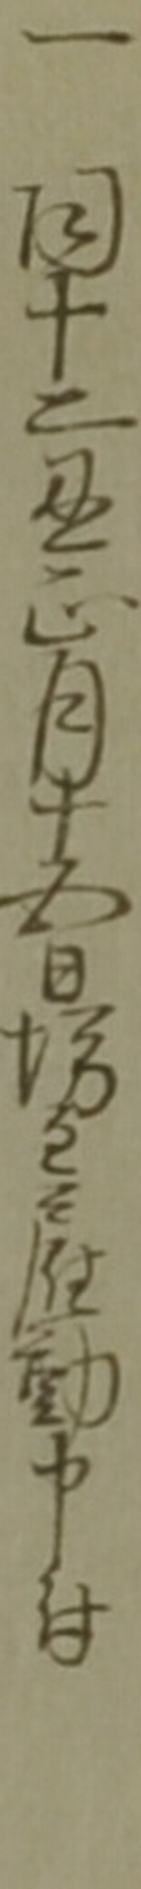一同十二丑正月十五日坊主雇勤申付
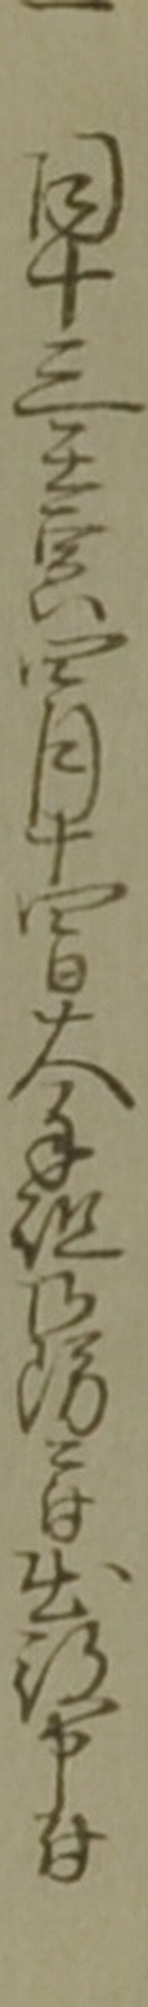一同十三壬寅四月十四日大手組御防ニ付出役申付
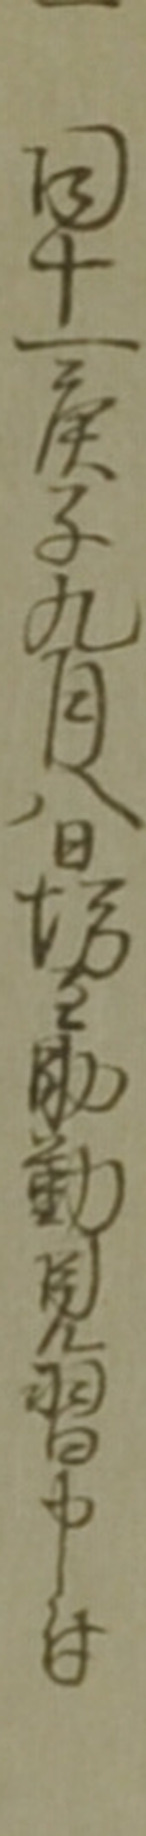一同十一庚子九月八日坊主助勤見習申付
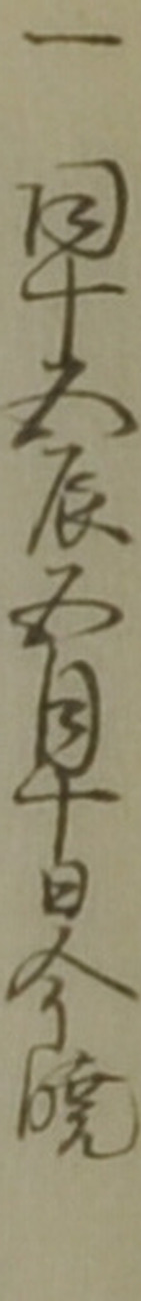一同十五辰五月十日今暁
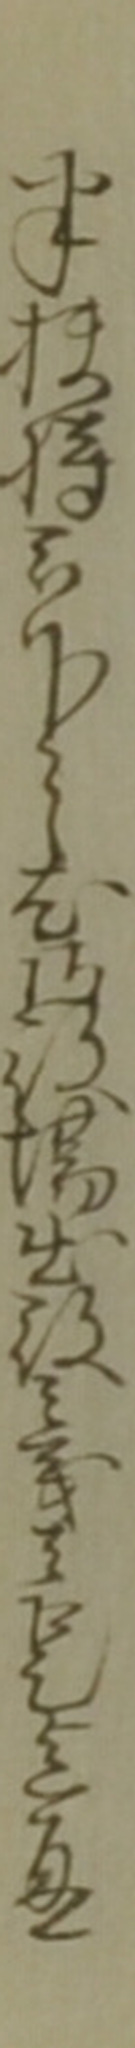半扶持被下之尤御役場出役之義者是迄通
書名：無足諸士勤仕録（七）
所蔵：伊那市立高遠町図書館・合同会社AMANE
